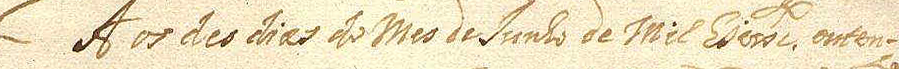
Aos des dias do Mes de Junho de Mil E seiscto. outen
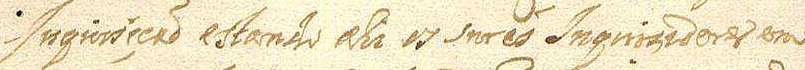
Jnquisiçaõ estando ahi os snres̄ Inquisidores em
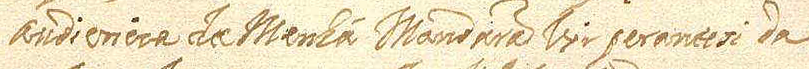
audiencia da Manhã Mandarão Vir perante si da
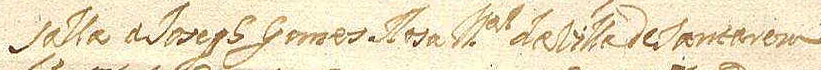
salla a Ioseph Gomes Rosa N.al da Villa de Santarem
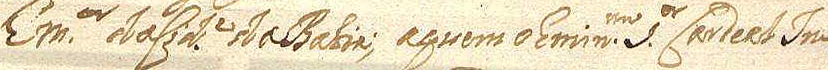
E m.or da Cid.e da Bahia; a quem o Emin.mo S.or Cardeal In
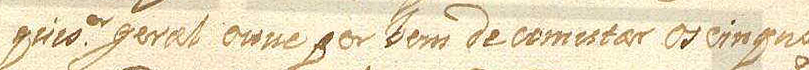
quis.or geral ouue por bem de comutar os cinquo
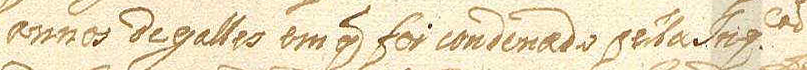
annos de galles em q̄ foi condenado pella Inq.caõ
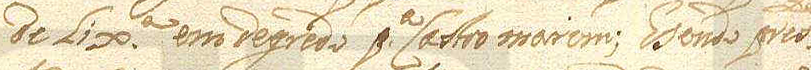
de Lix.a em degredo p.a Castro marim; E sendo pres.te
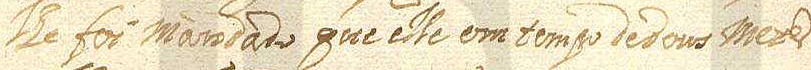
lhe foi mandado que elle em tempo de dous mezes
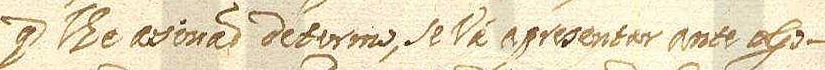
q̄ lhe asinaõ de termo, se Vá apresentar ante o Go
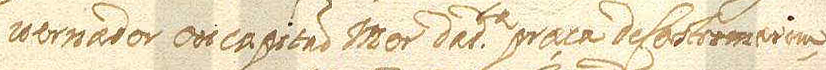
uernador ou capitaõ mor da d.a praça de Castro marim,
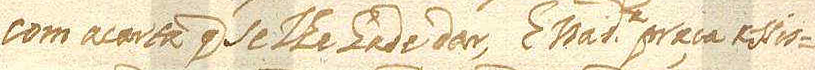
com a carta q̄ se lhe ha de dar, E na d.a praça assis
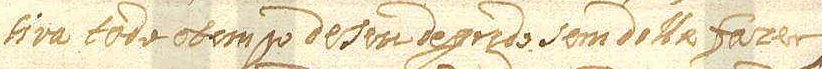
tira todo o tempo de seu degredo sem della fazer
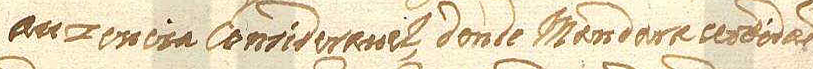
auzencia considerauel, donde Mandara certidaõ
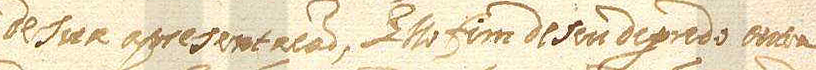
de sua apresentaçaõ, E no fim de seu degredo outra
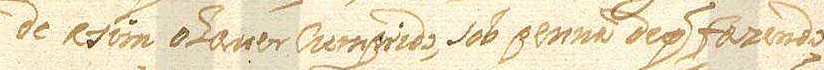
de asim o hauer cumprido, sob penna de q̄ fazendo
